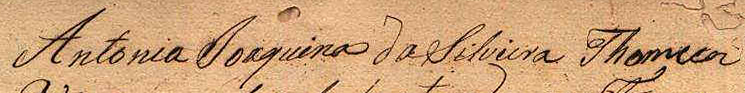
Antonia Ioaquina da Silveira Thomcen
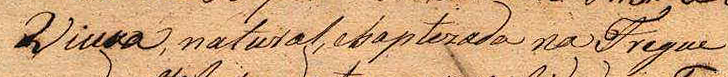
Viuva, natural, e baptizada na Fregue
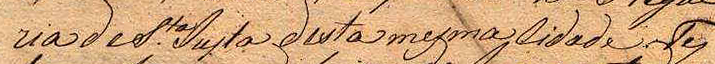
zia de S.ta Iusta desta mesma Cidade Tes
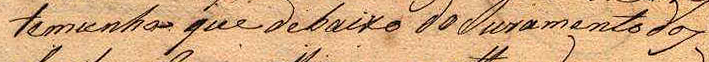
temunha que debaixo do Iuramento dos
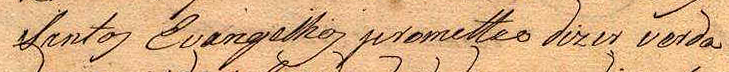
Santos Evangelhos prometteo dizer verda
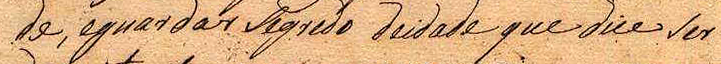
de, e guardar segredo de idade que dice ser
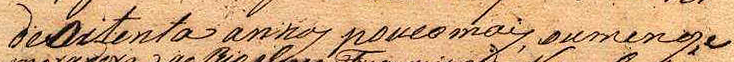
de Oitenta annos pouco mais ou menos, e
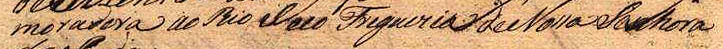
moradora ao Rio Seco Freguezia de Nossa Senhora
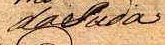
daIuda
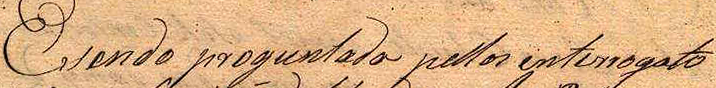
E sendo proguntada pellos interrogato
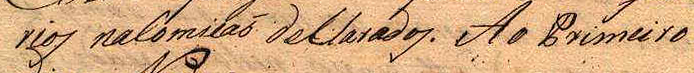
rios na Comiçaõ deClarados. Ao Primeiro
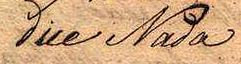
dice Nada
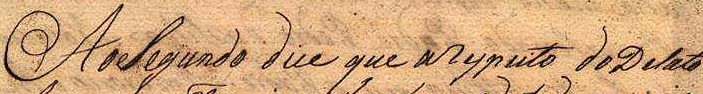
Ao Segundo dice que a Respeito do Delato
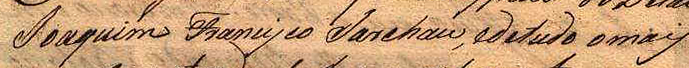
Ioaquim Francisco Iarchau, e de tudo o mais
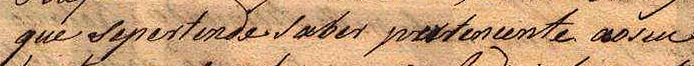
que se pertende saber pretencente ao seu
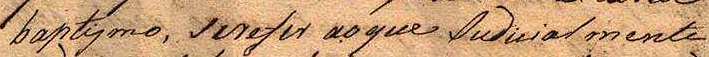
baptismo, se refer ao que Iudicialmente
